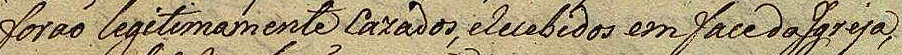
foraõ legitimamente cazados, e Recebidos em face da Jgreja,
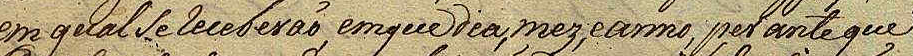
em qual se Receberaõ em que dia, mez, e anno perante que
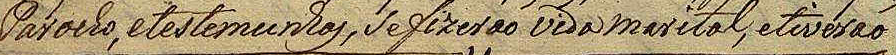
Parocho, e testemunhas, se fizeraõ vida marital, e tiveraõ
